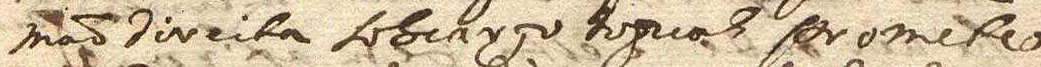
maõ direita sob cargo do qual prometeo
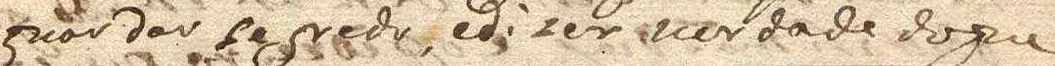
guardar segredo, e dizer uerdade do que
